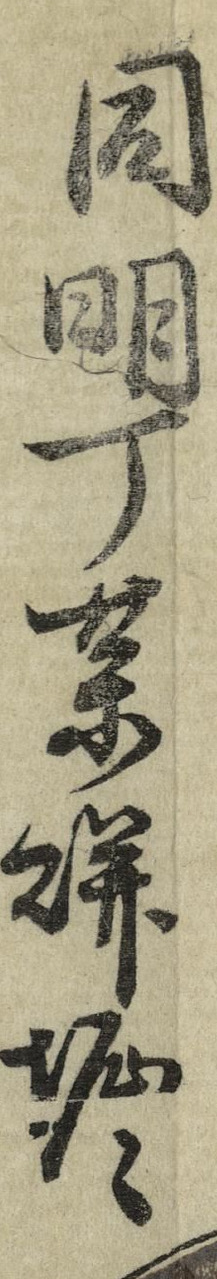同朋丁薬研堀
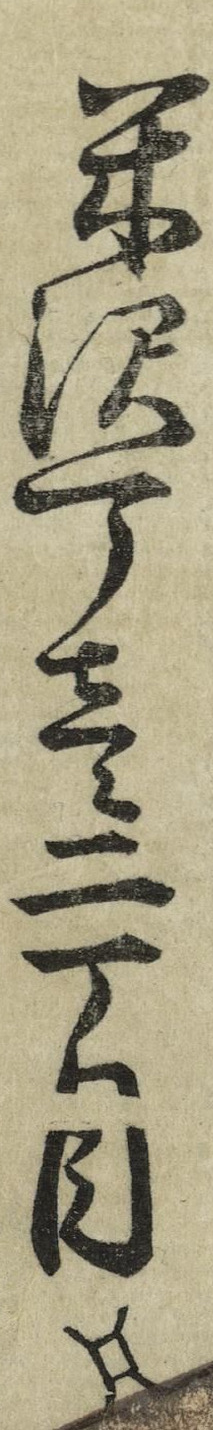米沢丁壱二丁目
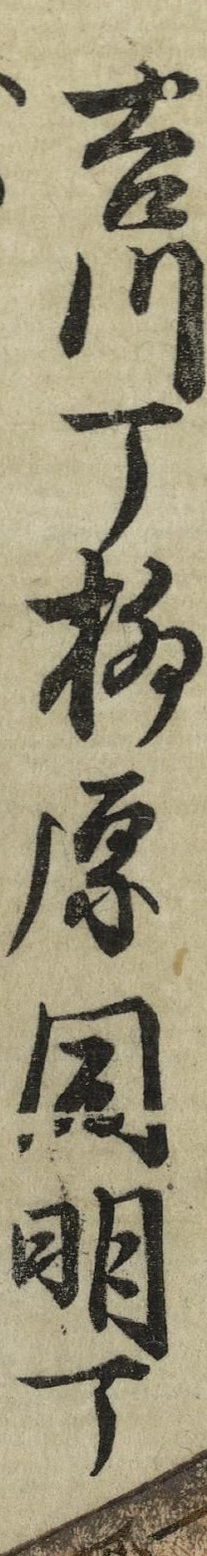吉川丁柳原同朋丁
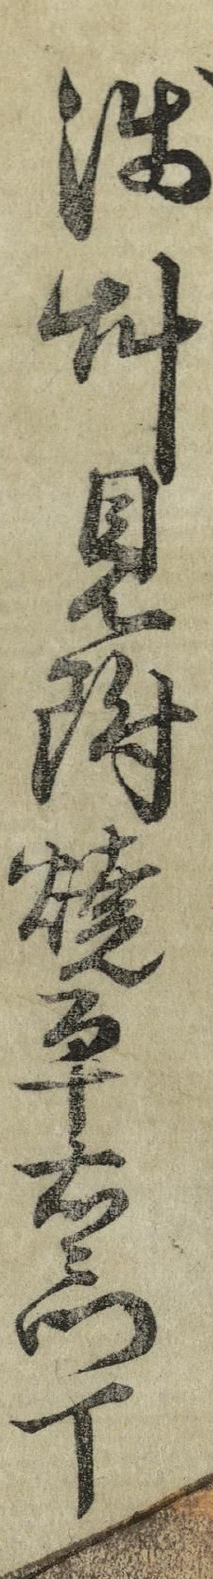浅艸見附焼平右衛門丁
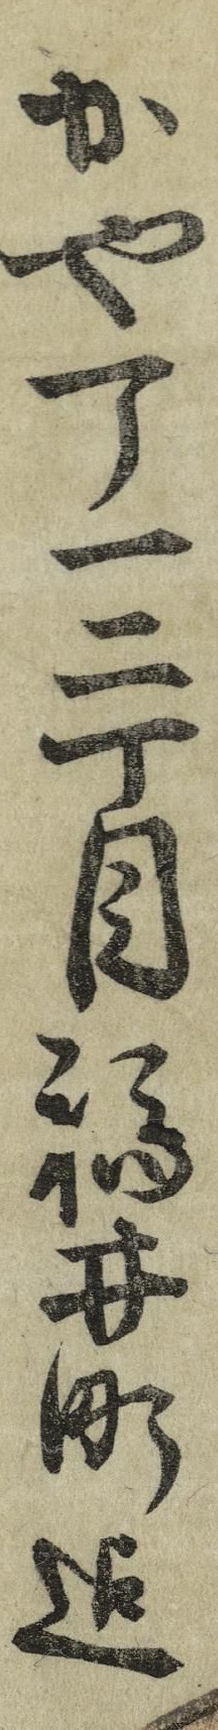かや丁一二丁目福井丁迄
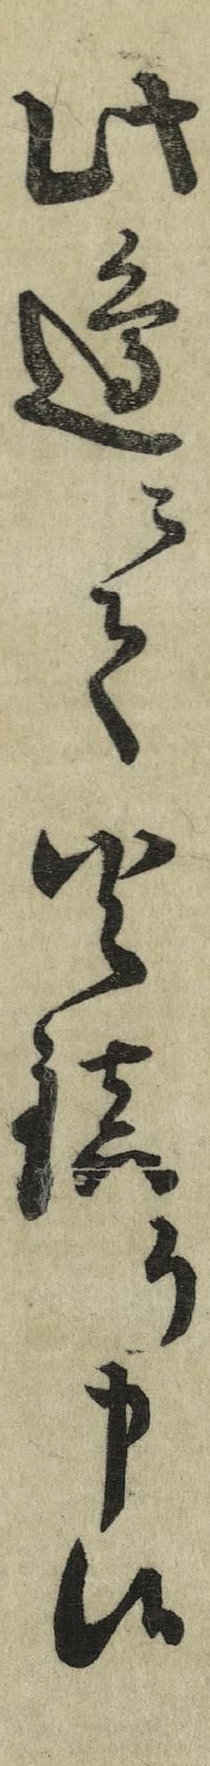此辺にて火鎮り申候
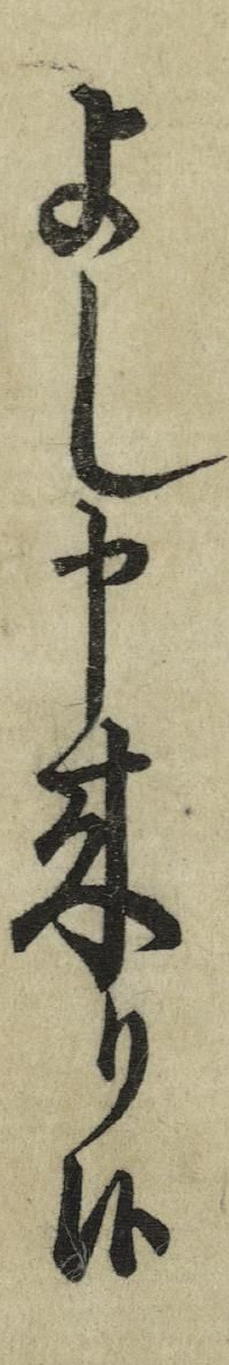よし申来り候
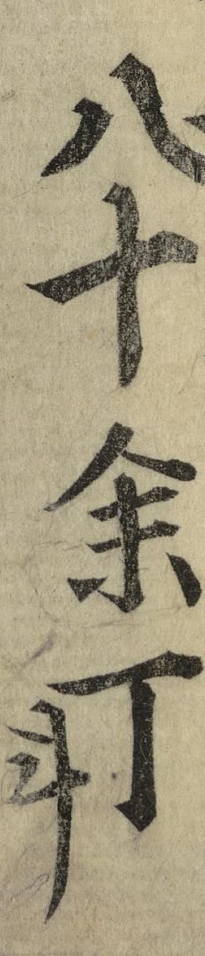八十余丁計
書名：江戸大火場所細見
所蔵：東京大学地震研究所図書室 Earthquake Research Institute Library, The University of Tokyo, JAPAN
